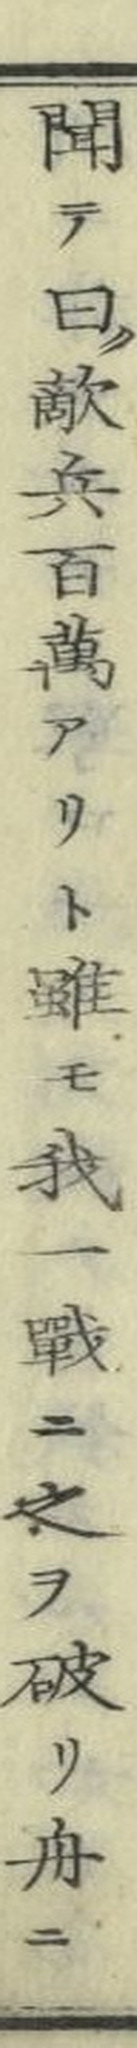聞テ曰歒兵百萬アリト雖モ我一戰ニ之ヲ破リ舟ニ
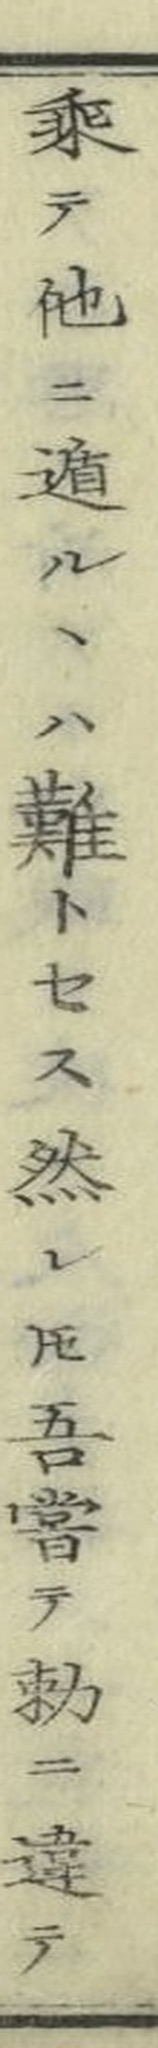乘テ他ニ遁ルヽハ難トセス然レトモ吾嘗テ勅ニ違テ
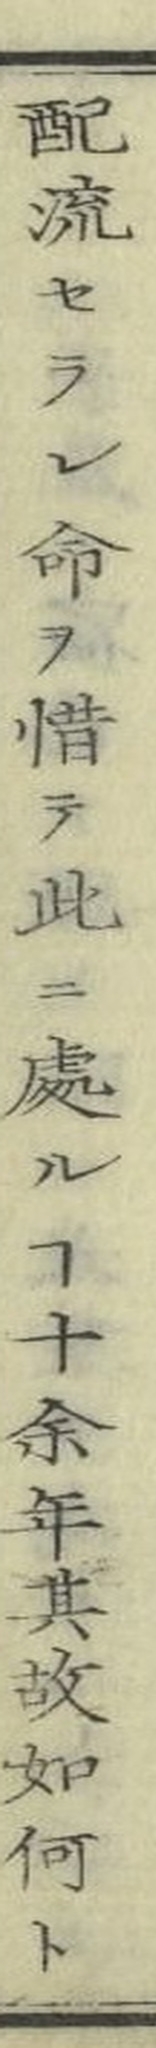配流セラレ命ヲ惜テ此ニ處ルコト十余年其故如何ト

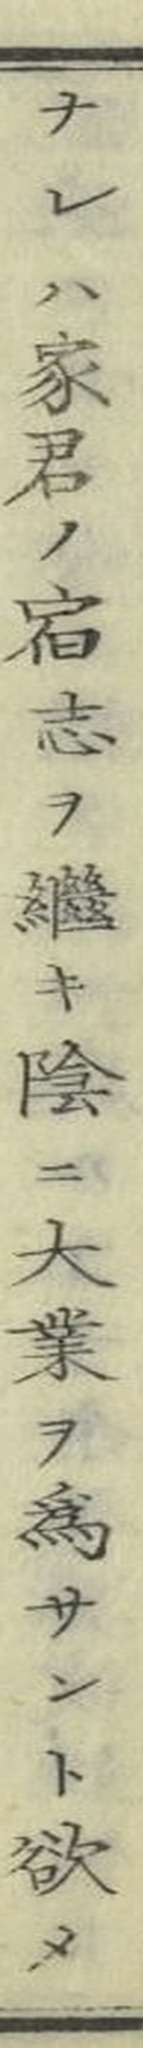ナレハ家君ノ宿志ヲ繼キ陰ニ大業ヲ爲サント欲シメ
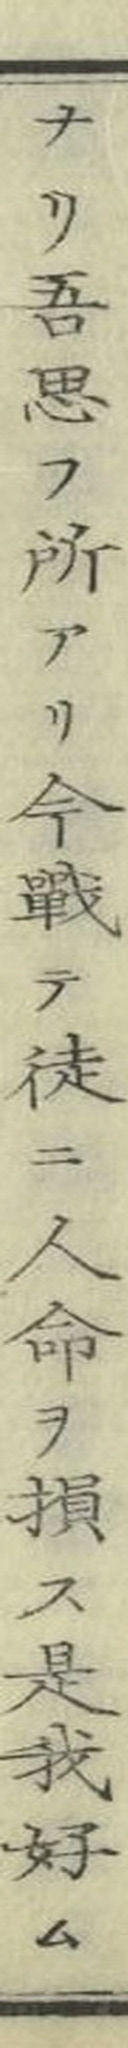ナリ吾思フ所アリ今戰テ徒ニ人命ヲ損ス是我好ム
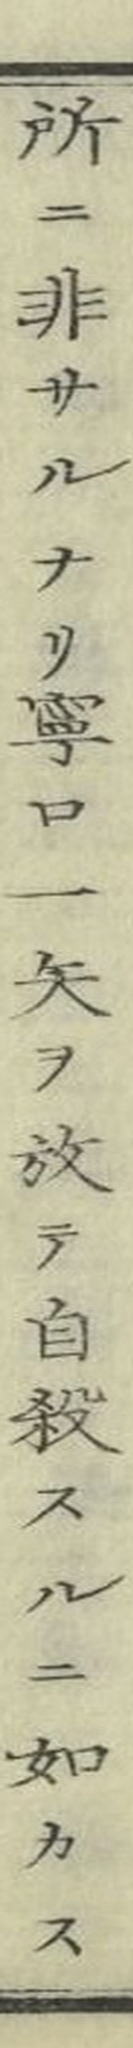所ニ非サルナリ寧ロ一矢ヲ放テ自殺スルニ如カス
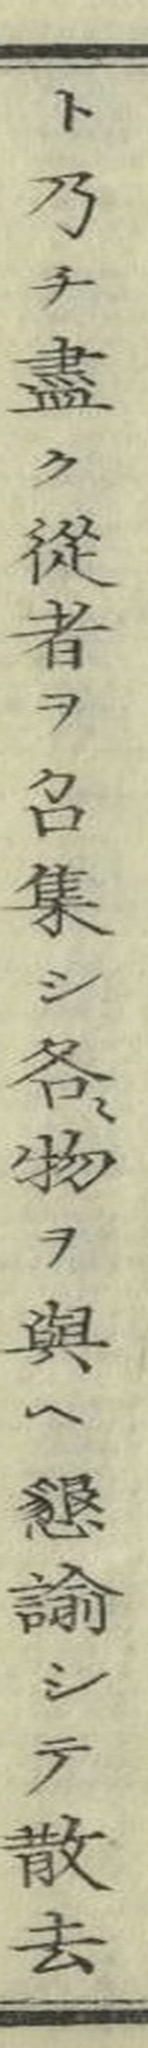ト乃チ盡ク從者ヲ召集シ各〻物ヲ與ヘ懇論シテ散去
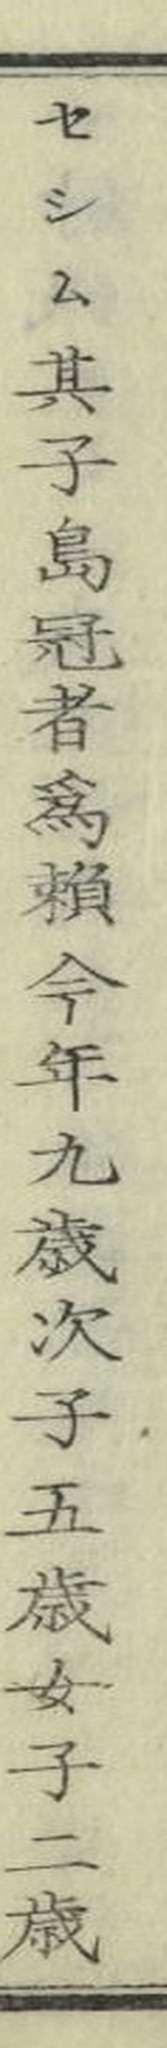セシム其子島冠者爲頼今年九歲次子五歲女子二歳
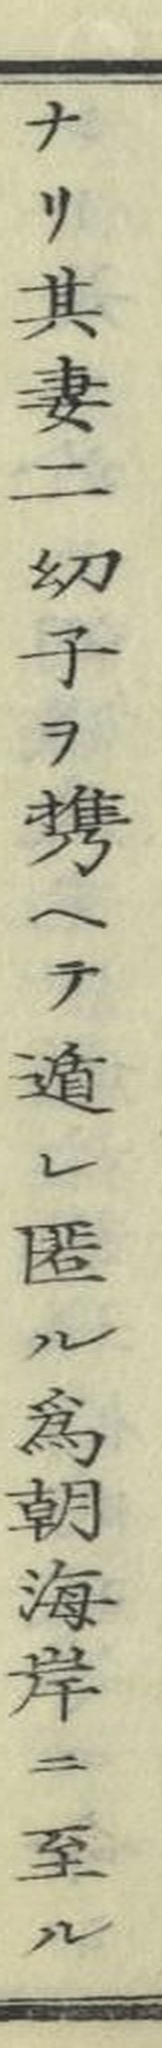ナリ其妻二幼子ヲ携ヘテ遁レ匿ル爲朝海岸ニ至ル
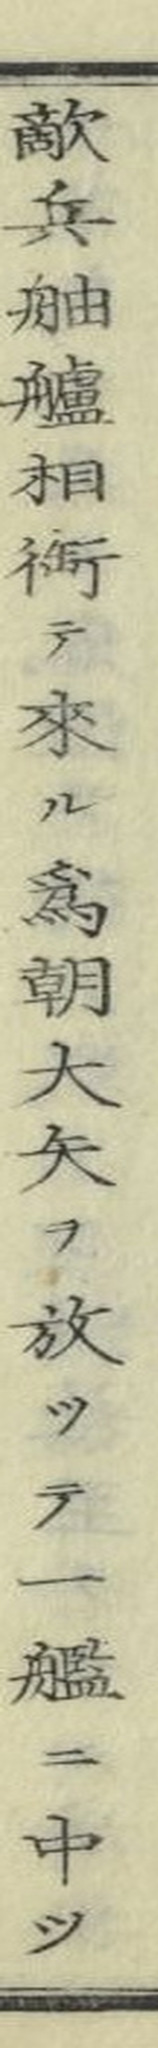歒兵舳艫相衘テ來ル爲朝大矢ヲ放ツテ一艦ニ中ツ
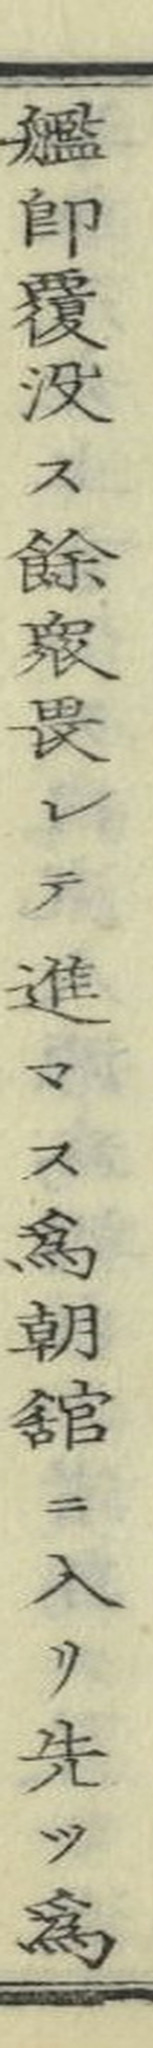艦即覆没ス餘衆畏レテ進マス爲朝舘ニ入リ先ユ爲
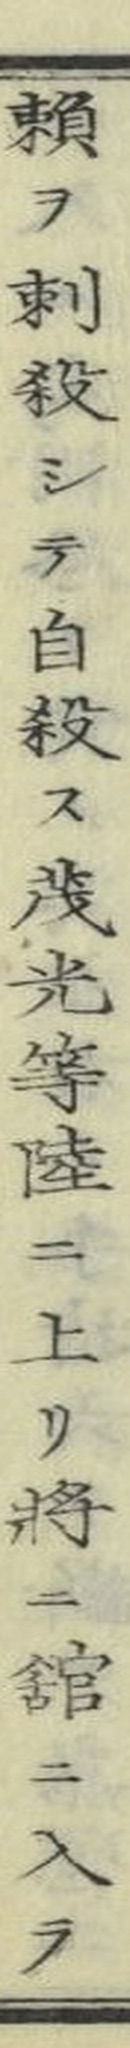賴ヲ刺殺シテ自殺ス茂光等陸ニ上リ將ニ舘ニ入ラ
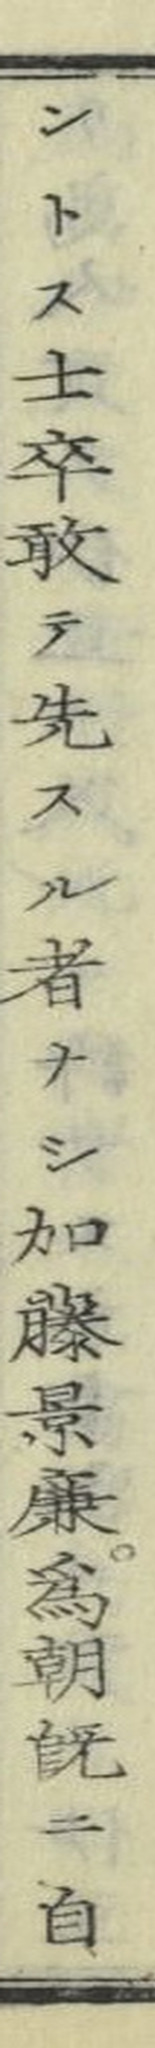ントス士卒敢テ先スル者ナシ加藤景廉。爲朝既ニ自
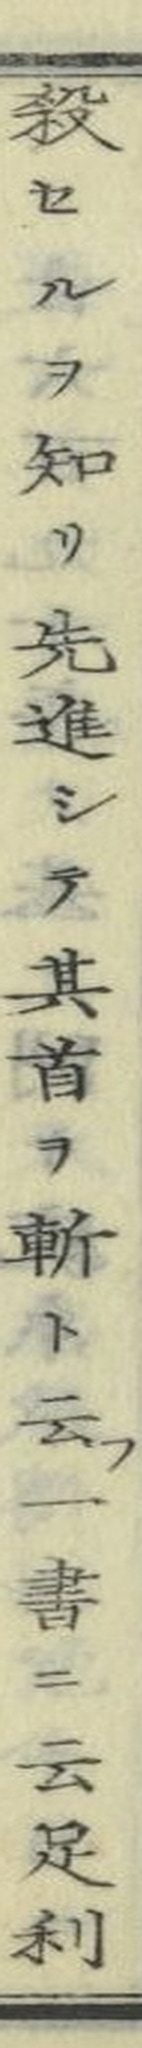殺セルヲ知リ先進シテ其首ヲ斬ト云一書ニ云足利
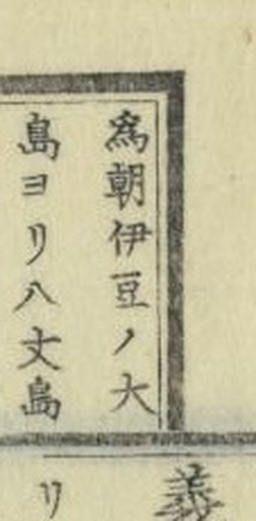爲朝伊豆ノ大
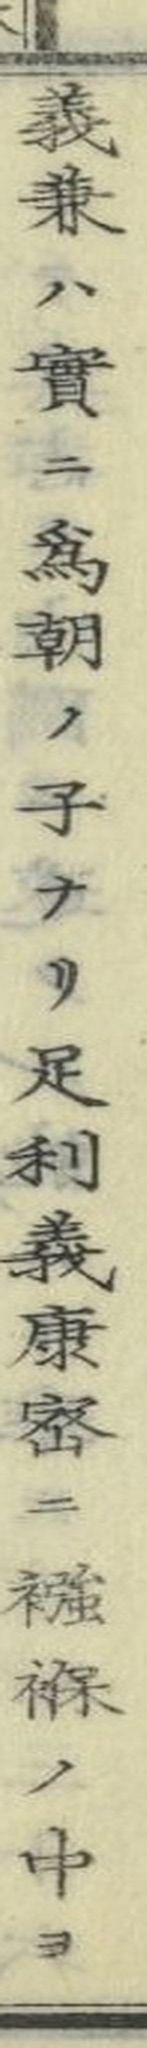義兼ハ實ニ爲朝ノ子ナリ足利義康密ニ襁褓ノ中ヨ
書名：琉球藩史 一之巻
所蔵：University of the Ryukyus Library
